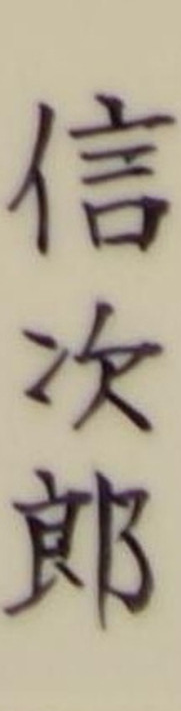信次郎
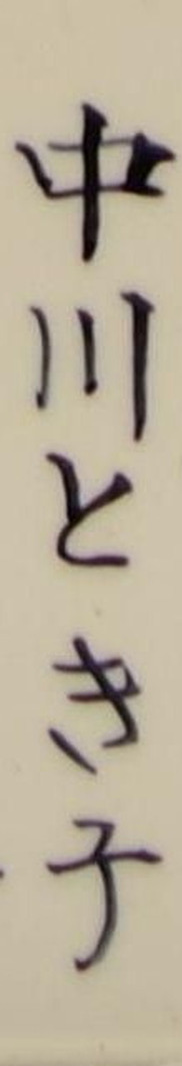中川とき子
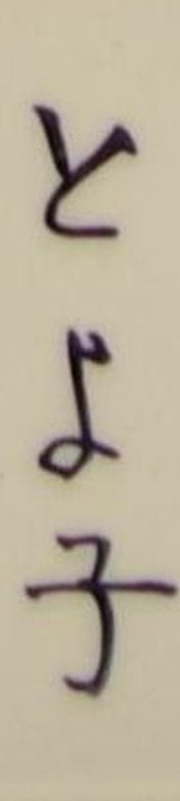とよ子
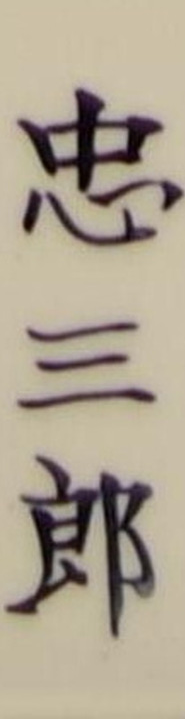忠三郎
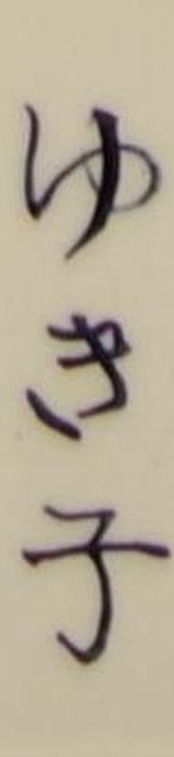ゆき子
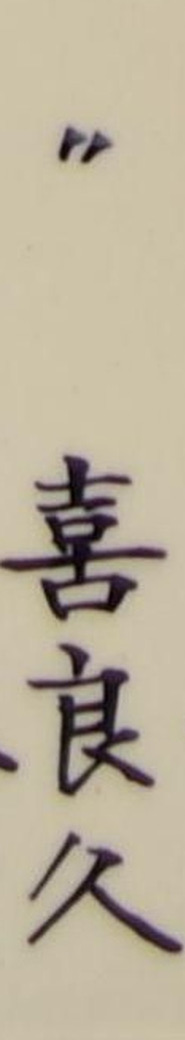喜良久
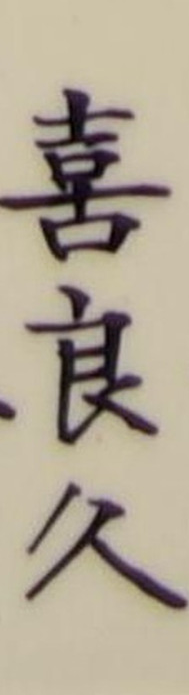喜良久
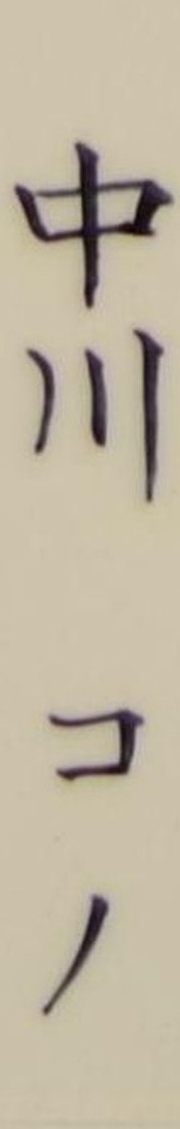中川コノ
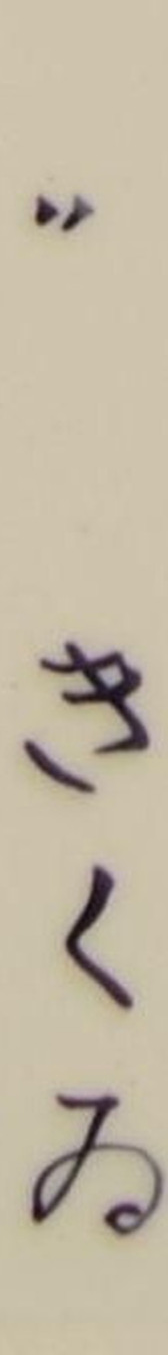きくゐ
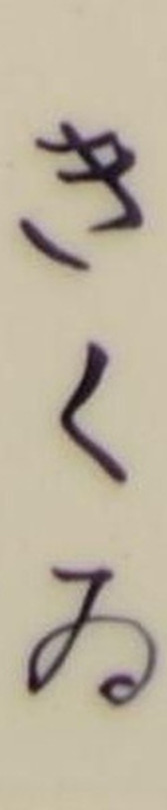きくゐ
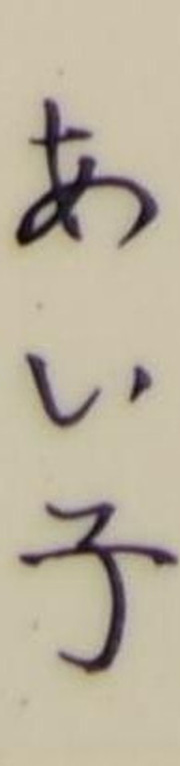あい子
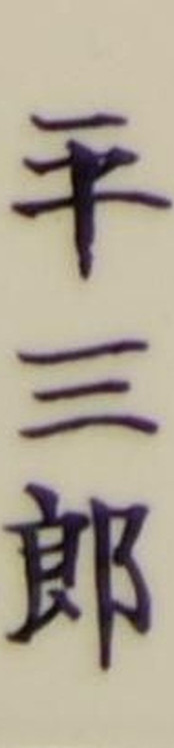平三郎

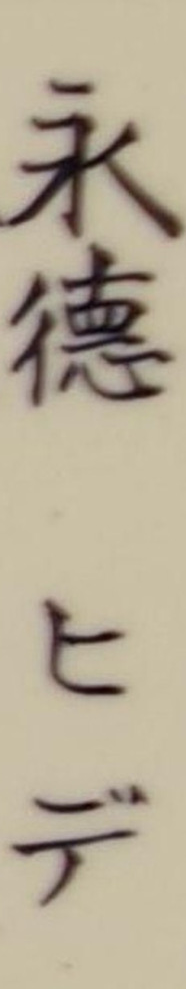永徳ヒデ
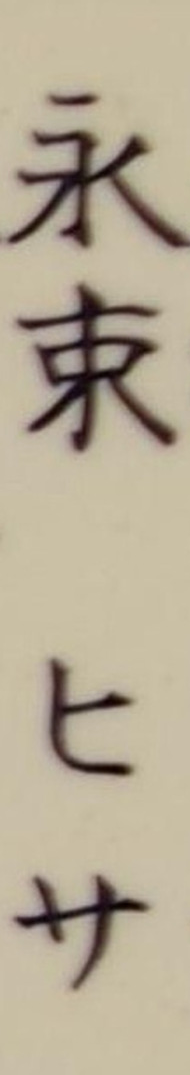永束ヒサ
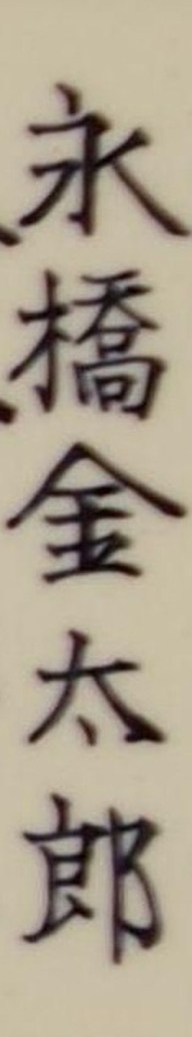永橋金太郎
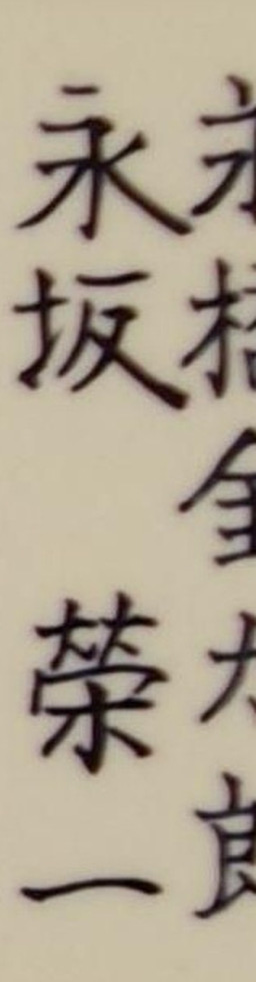永坂榮一
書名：A~D
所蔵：koyasan kongobuji
